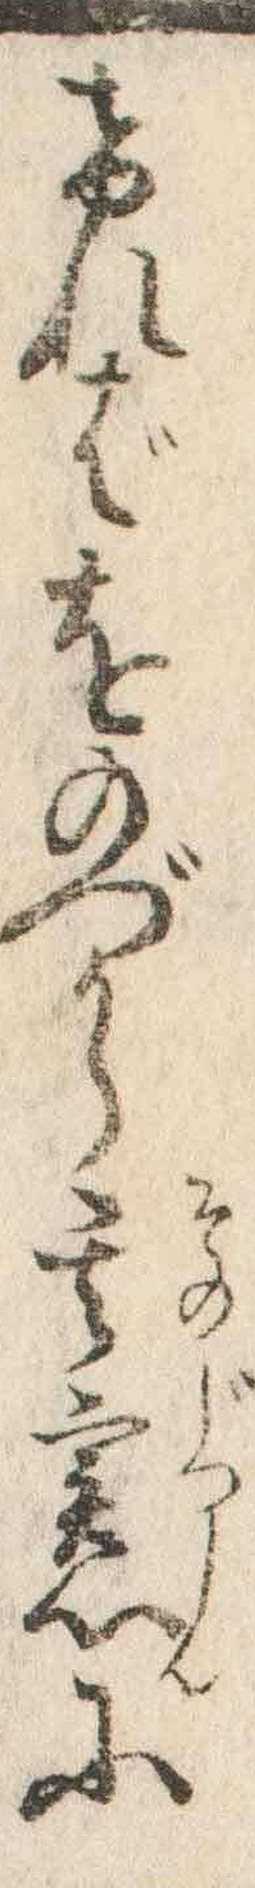ければをのづから其実心に
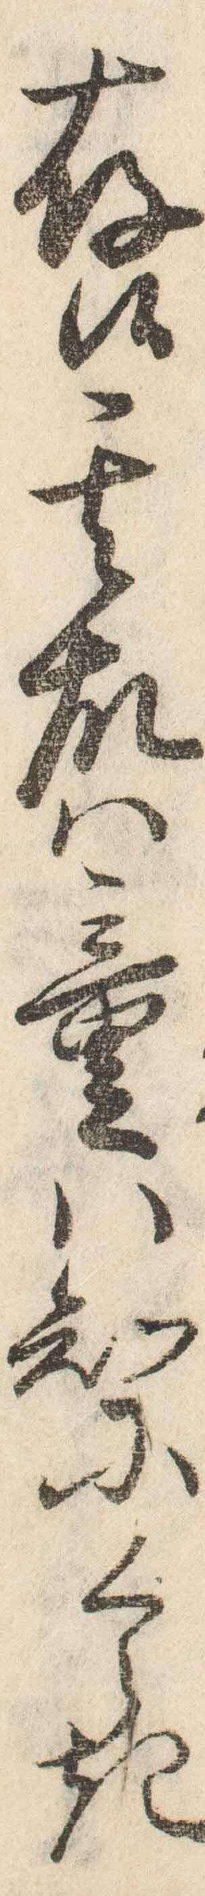存候其故は童は知にくらき
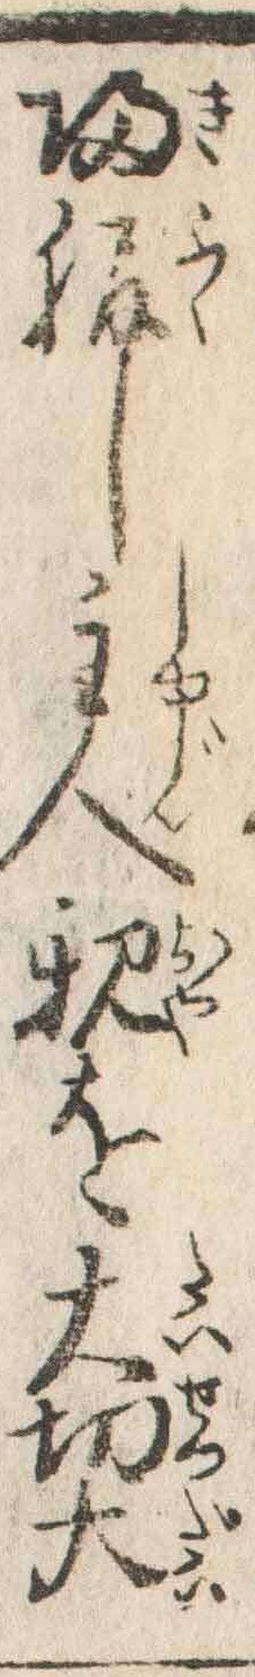帰服し主人親を大切大
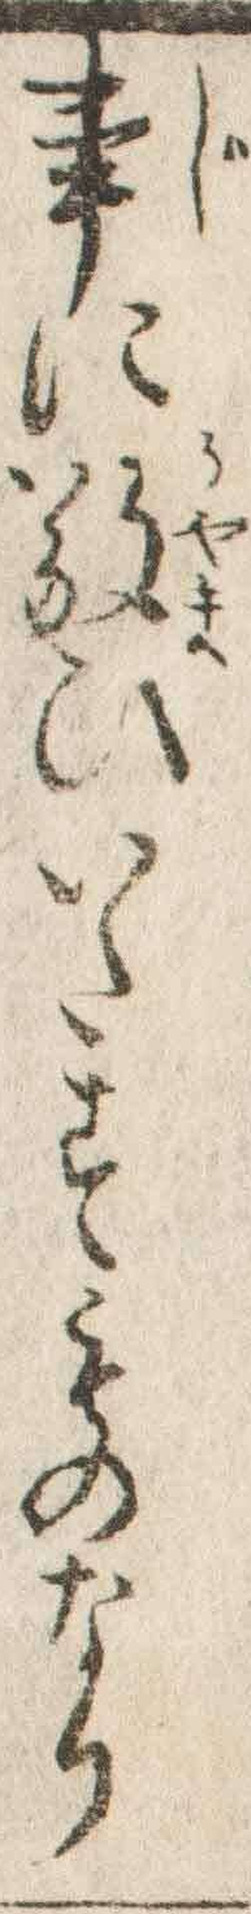事に敬ひいたすものなり
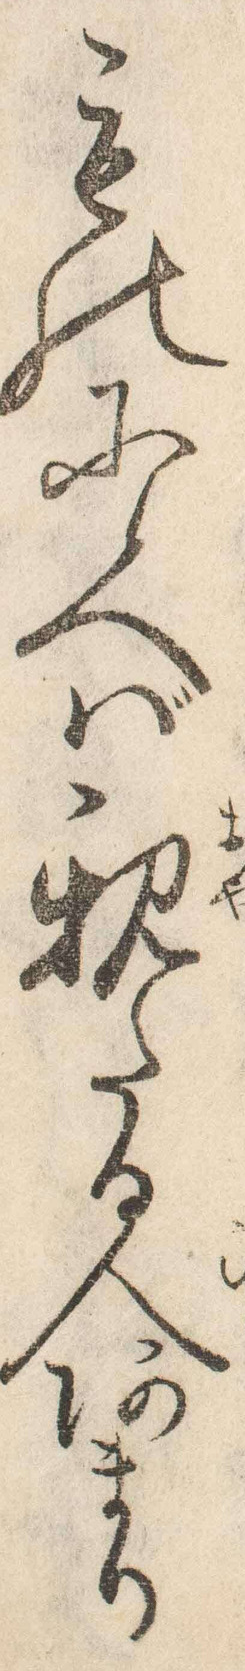ものに候へば親たる人あまり
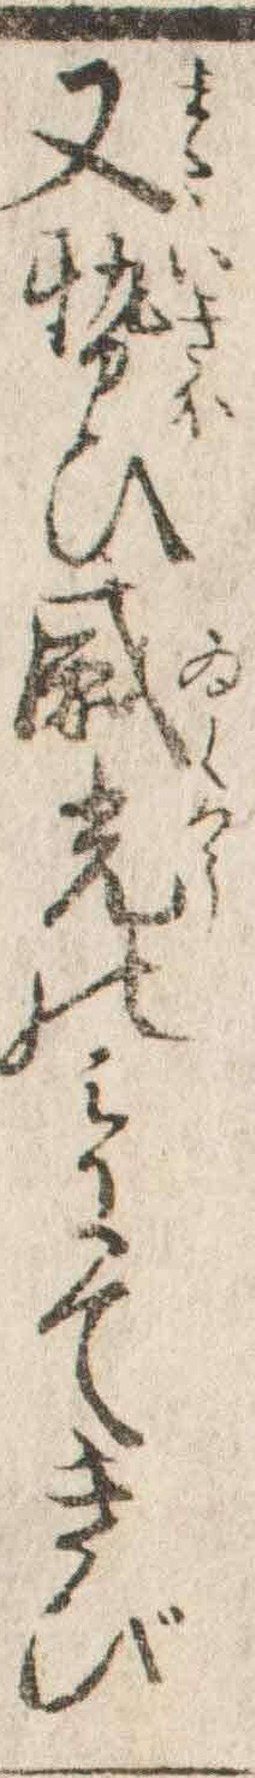又勢ひ威光のみにてきび
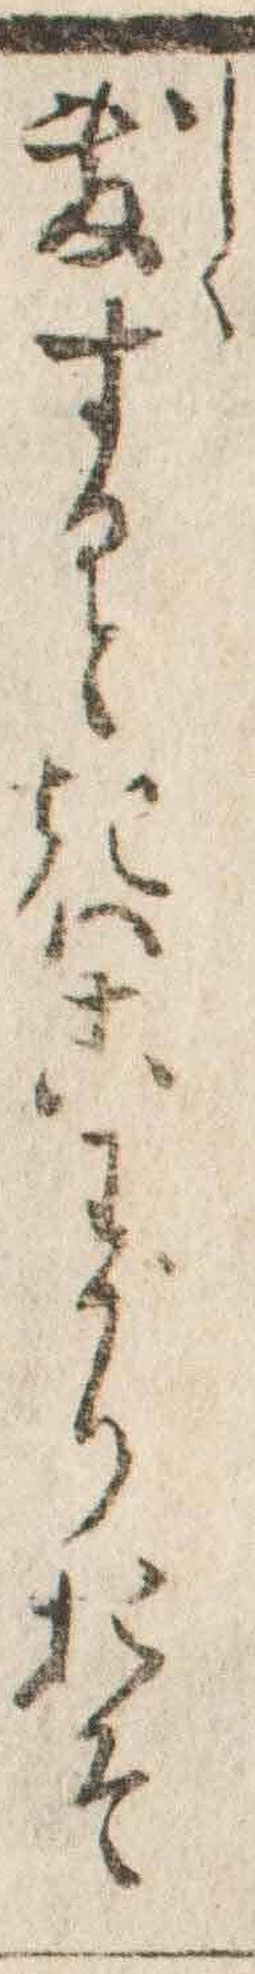敷するときはこわがりおそ
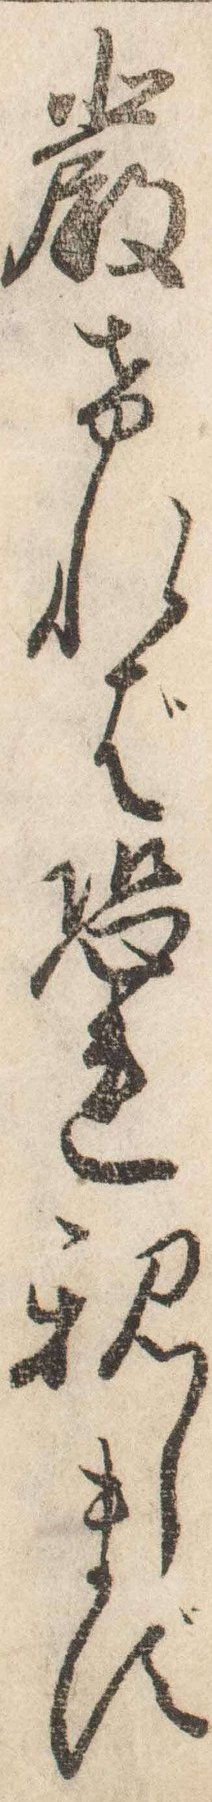厳ければ恐れ親しまず
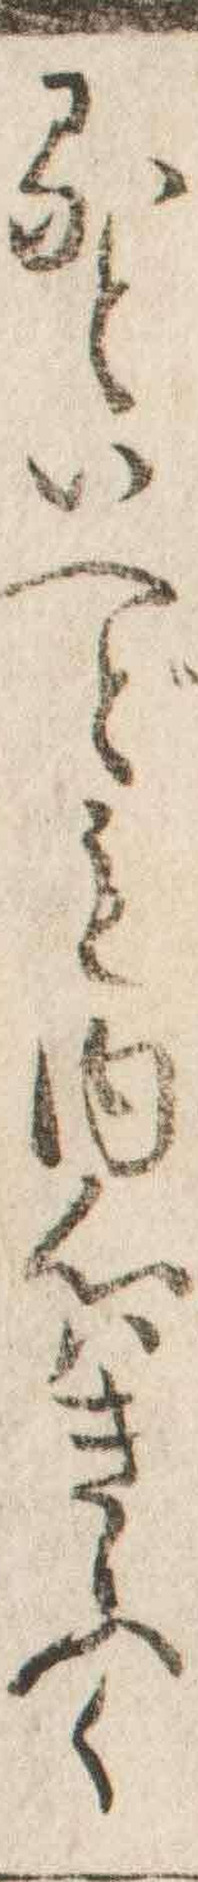るといへども内心はきふく
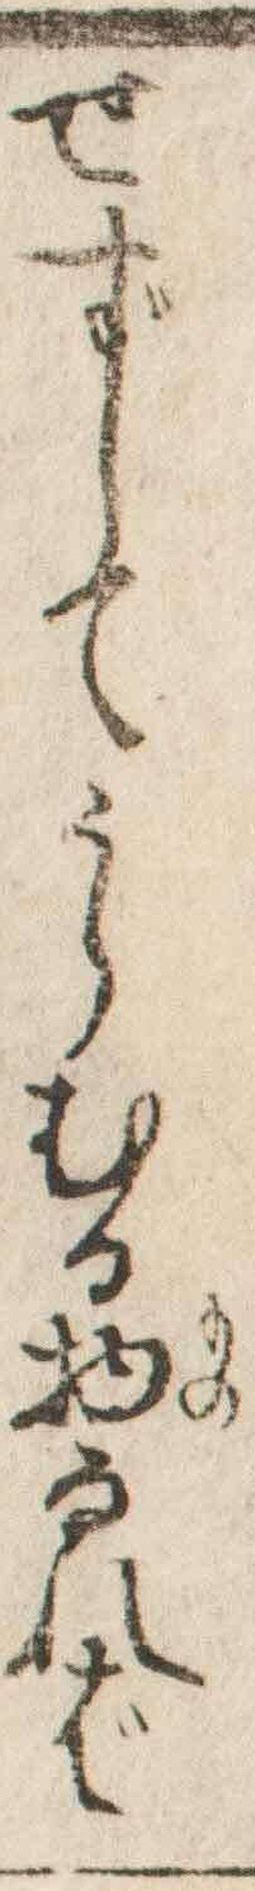せずしてうらむる物なれば
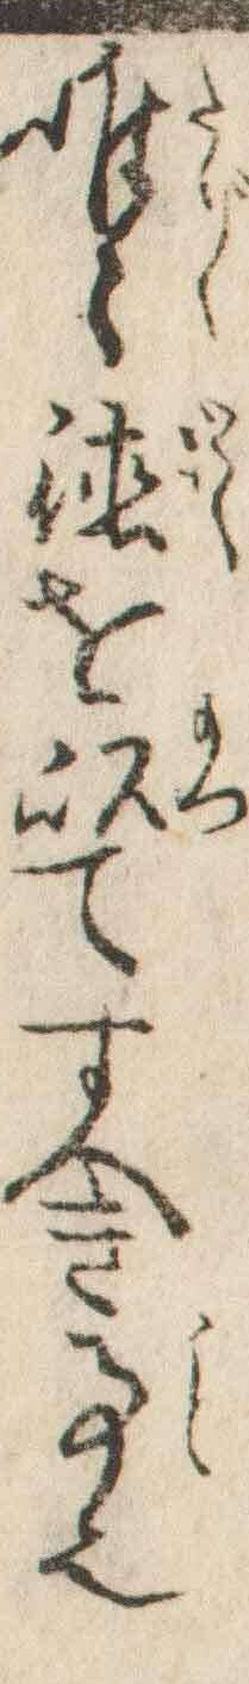唯々徳を以てすへき事也
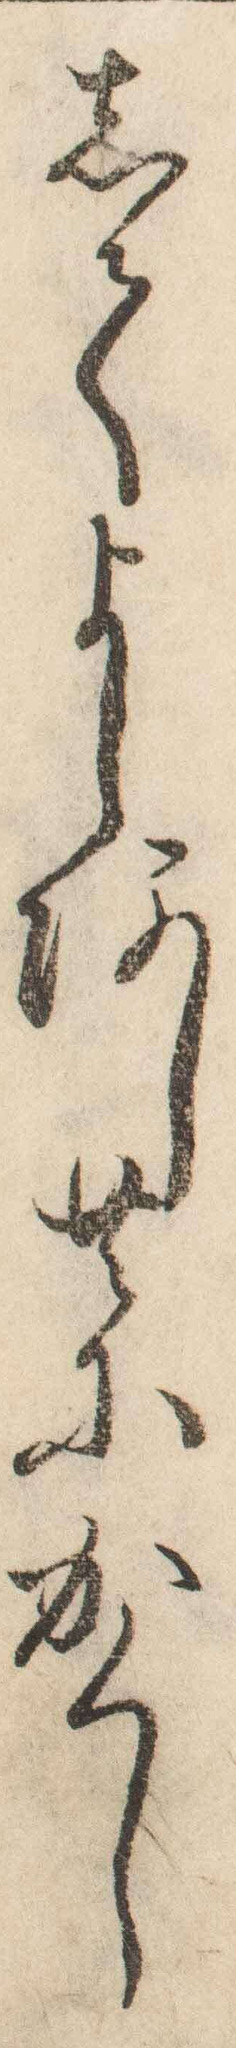してよしあし共にかくし

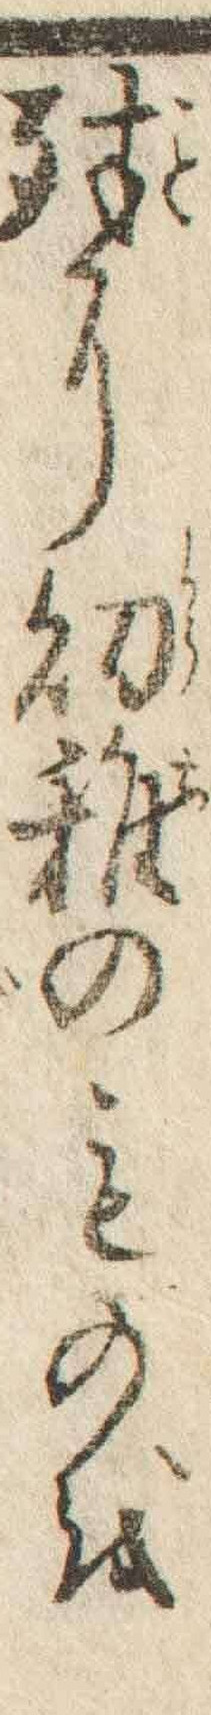殊に幼稚のものを
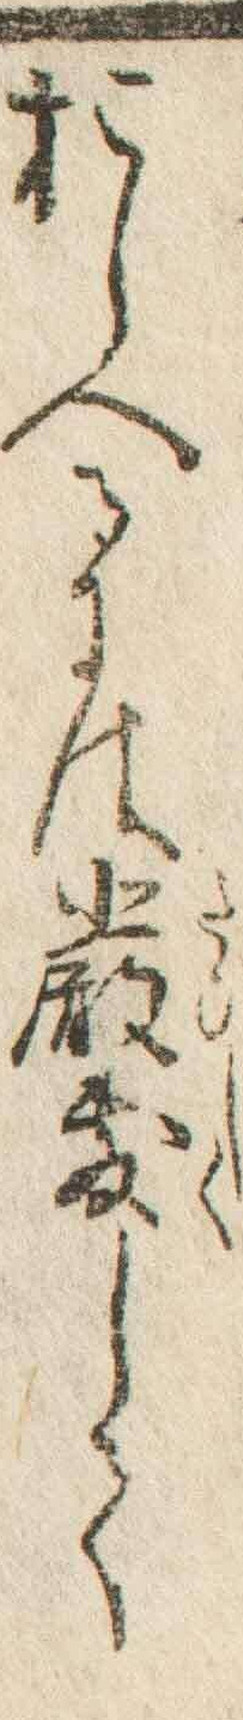おしへるには厳敷して
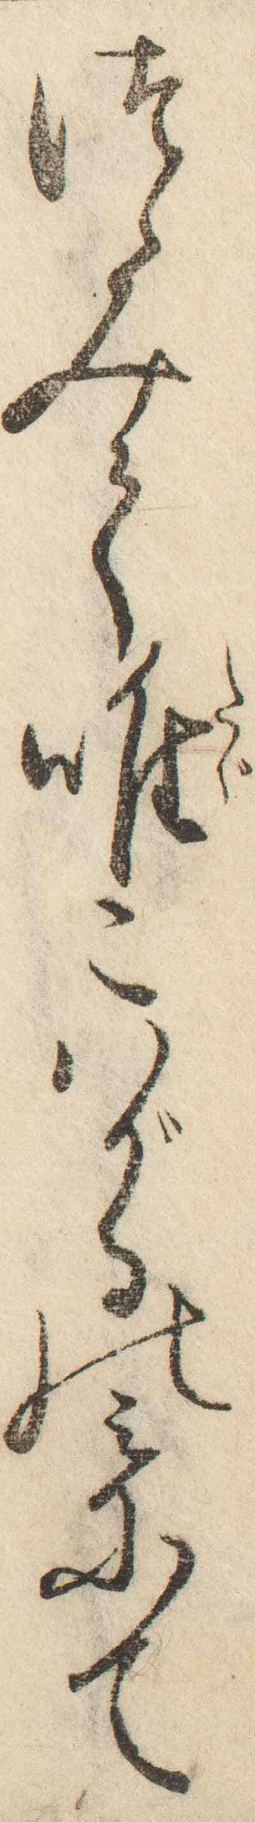つゝみて唯こはがるのみにて
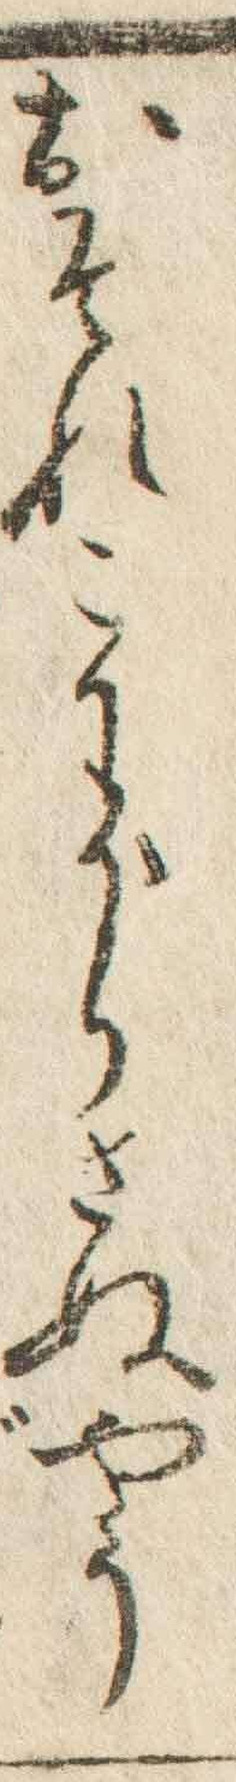おそれこわからさぬやう
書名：撫育草
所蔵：東京学芸大学附属図書館 国文学研究資料館
